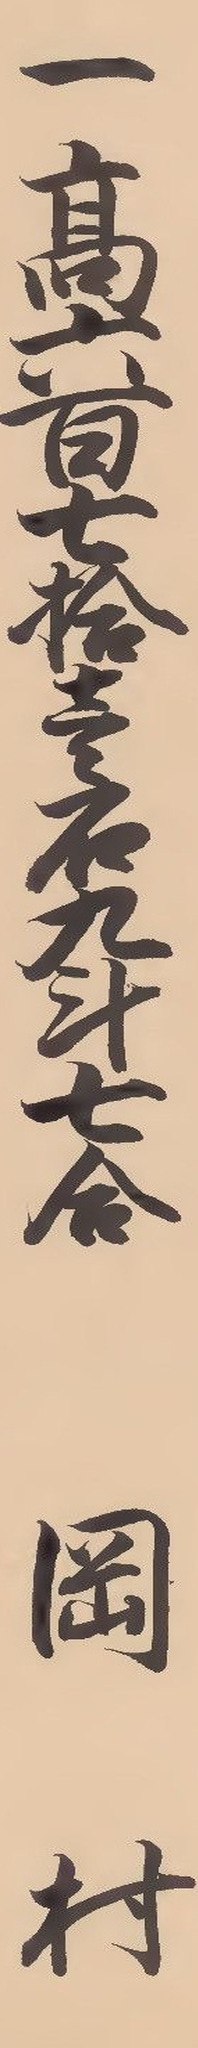一高六百七拾壱石九斗七合岡村
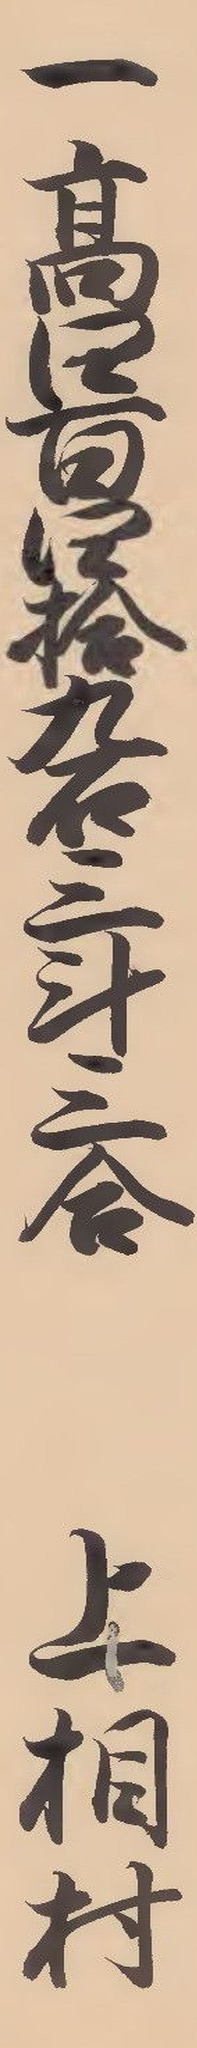一高四百四拾九石三斗三合上相村
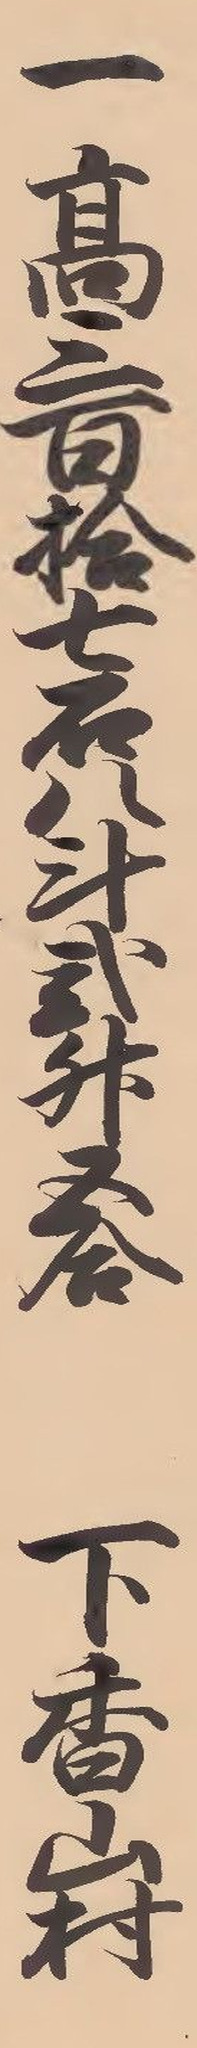一高三百拾七石八斗弐升五合下香山村
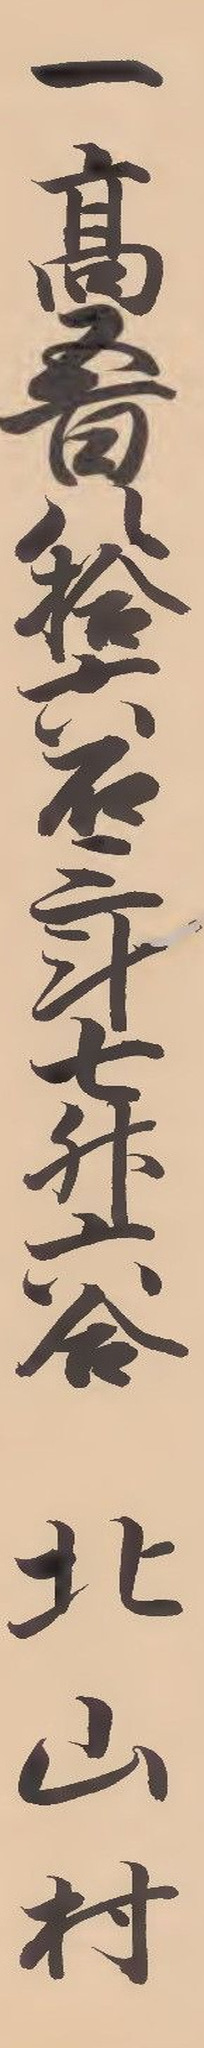一高五百八拾六石三斗七升六合北山村
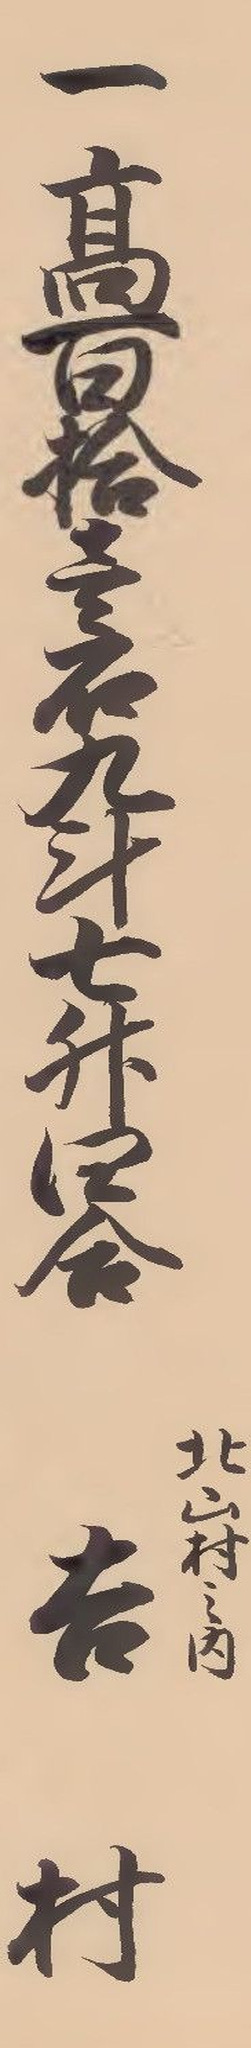一高六百七拾壱石九斗七合岡村
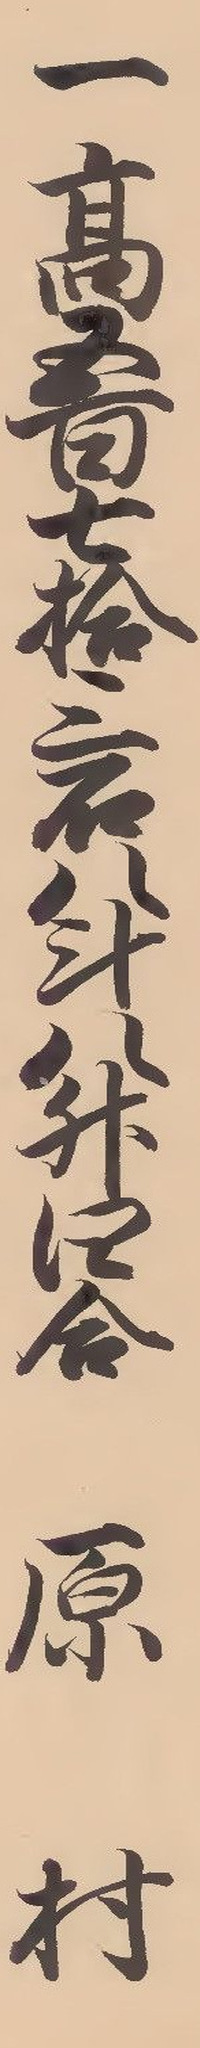一高五百七拾三石八斗八升四合原村

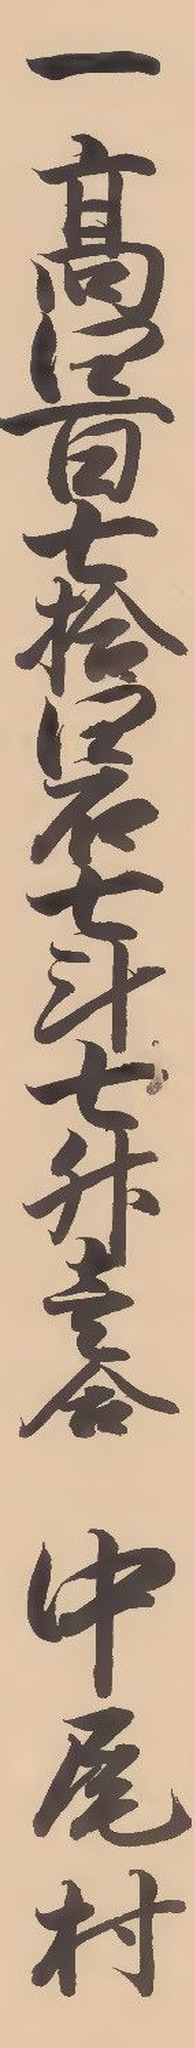一高四百七拾四石七斗七升壱合中尾村
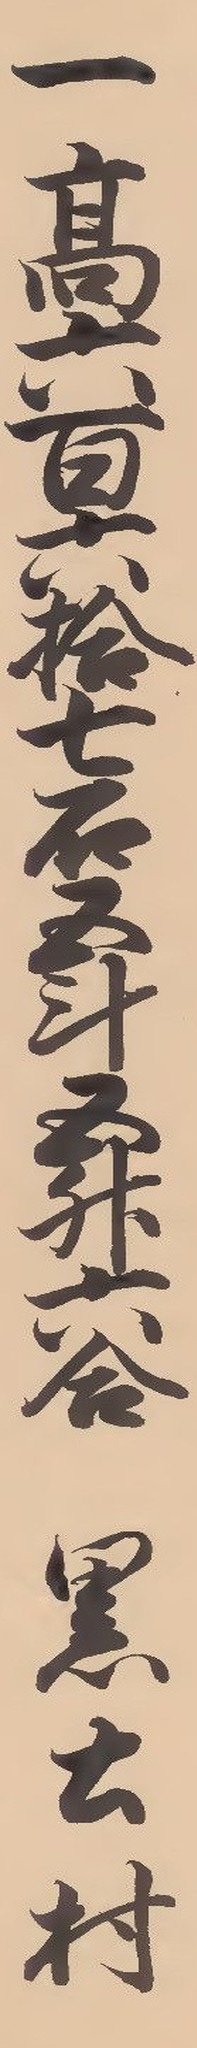一高六百六拾七石五斗五升六合黒土村
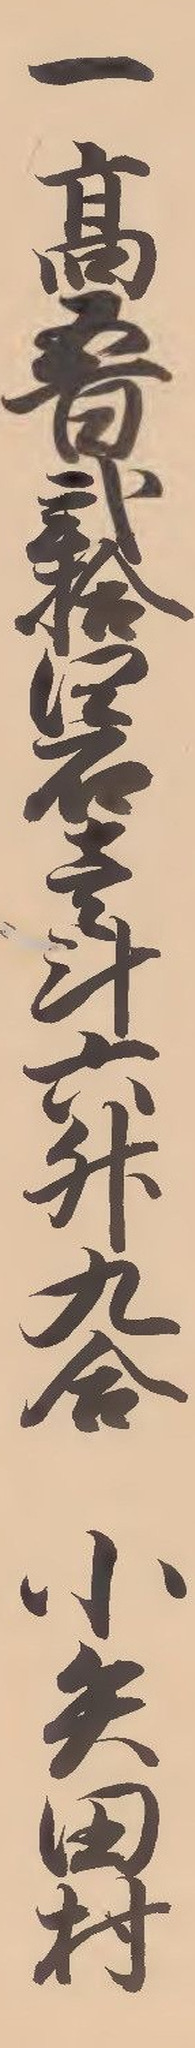一高五百弐拾四石壱斗六升九合小矢田村
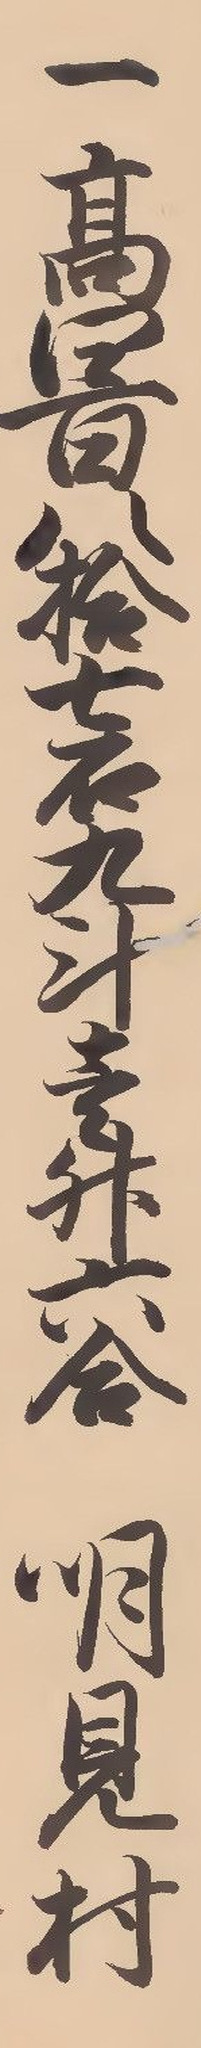一高四百八拾七石九斗壱升六合明見村
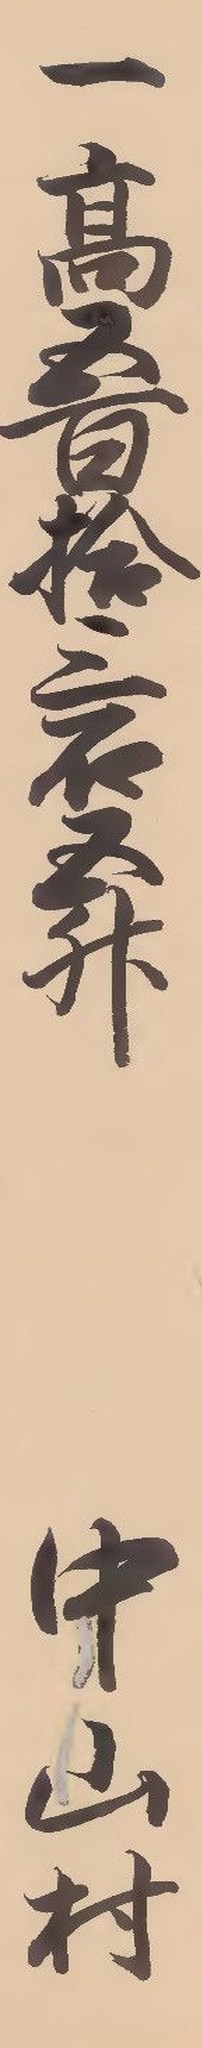一高五百拾三石五升中山村
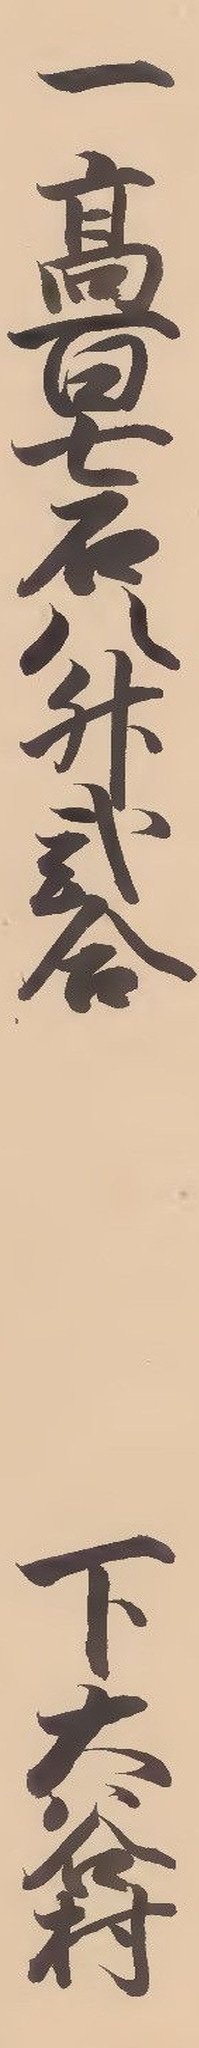一高百七石八升弐合下大谷村
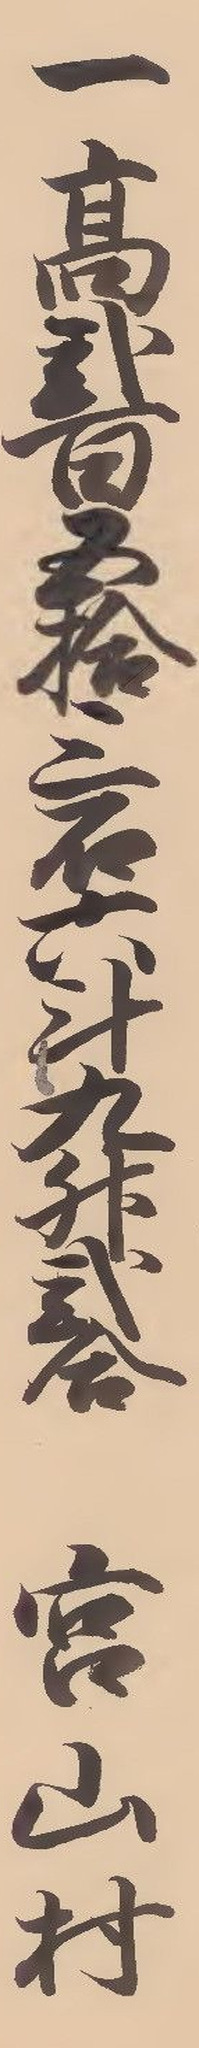一高弐百五拾三石六斗九升弐合宮山村

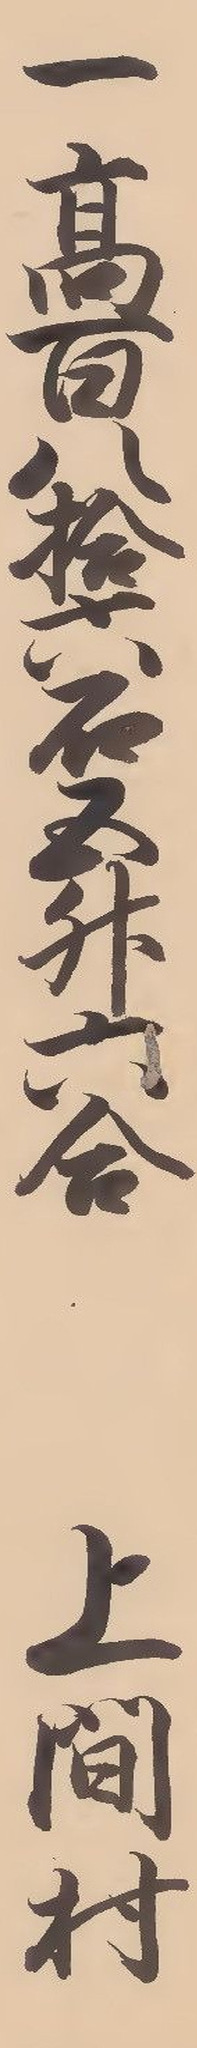一高百八拾六石五升六合上間村
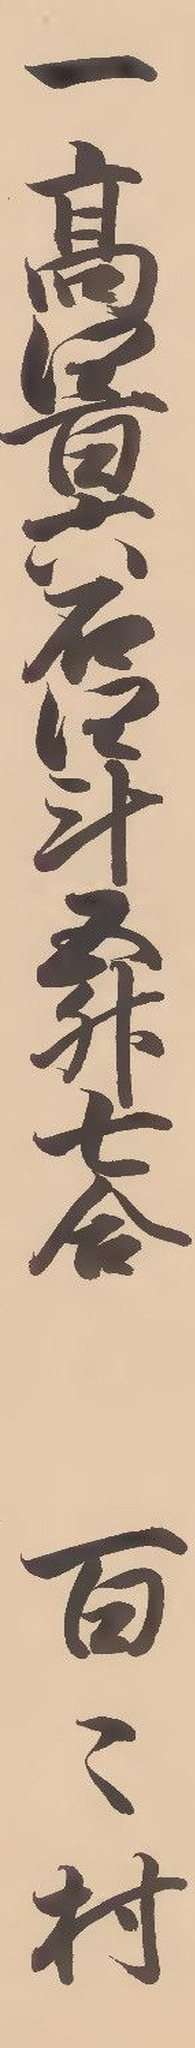一高四百六石四斗五升七合百々村
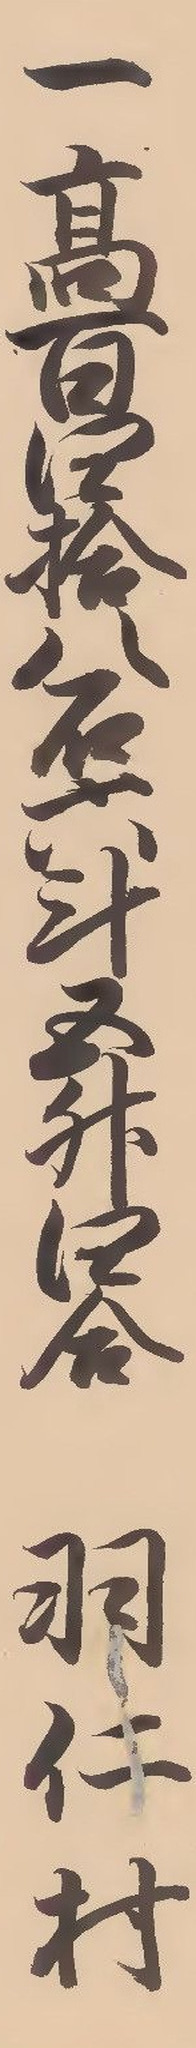一高百四拾八石六斗五升四合羽仁村
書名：美作国郷帳
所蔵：国立公文書館 National Archives of Japan
